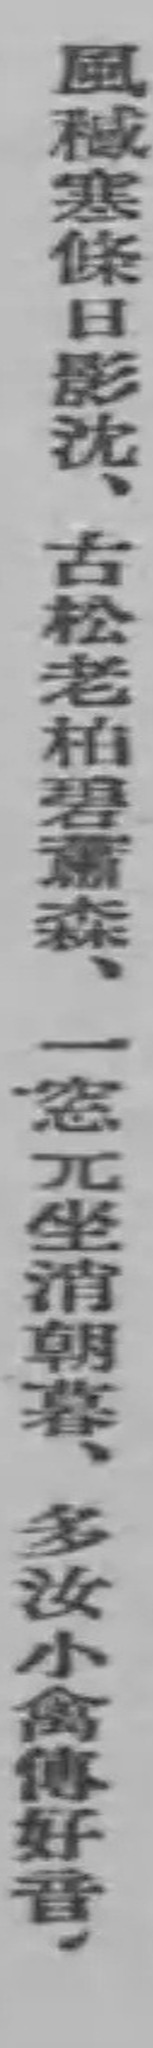風穢寒條日影沈、古松老柏碧蕭森、一窓兀坐消朝暮、多汝小禽傳好音、
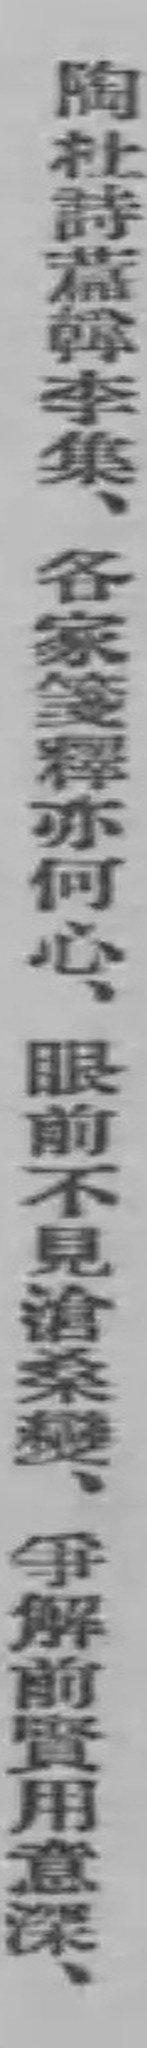陶杜詩萹韓李集、各家箋釋亦何心、眼前不見滄桑変、爭解前賢用意深、
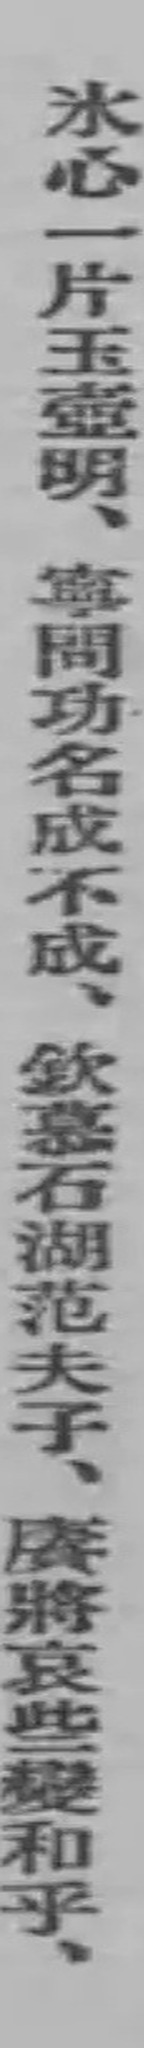氷心一片玉壷明、寧問功名成不成、欽慕石湖范夫子、賡将哀些変和乎、
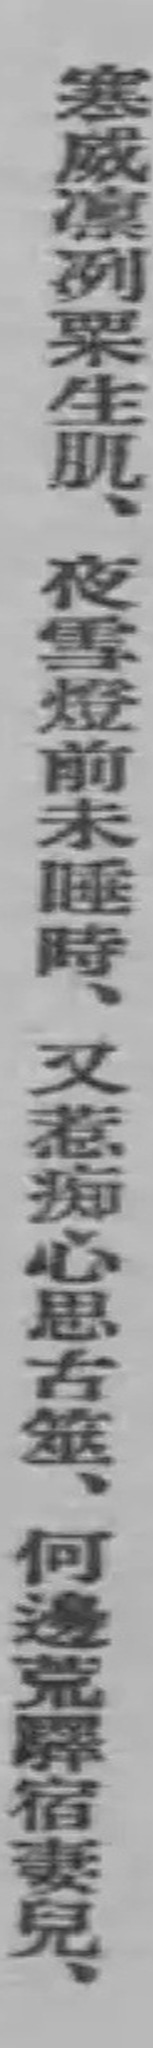寒威凛冽粟生肌、夜雪燈前未睡時、又惹痴心思古筮、何辺荒駅宿妻児、
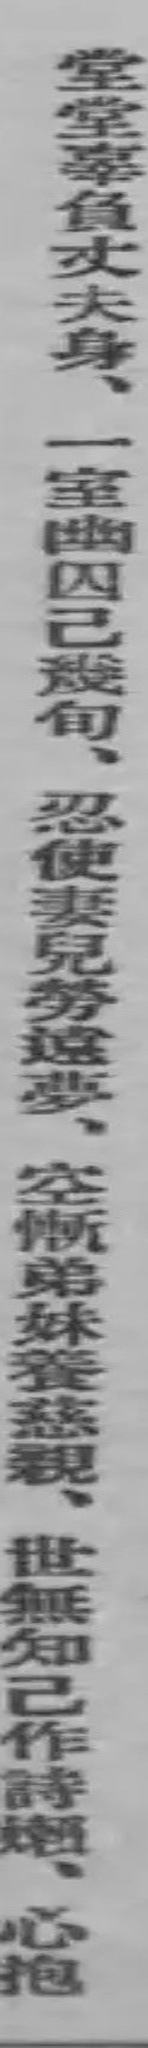堂堂辜負丈夫身、一室幽囚己幾旬、忍使妻児労遠夢、空慚弟妹養慈親、世無知己作詩嬾、心抱
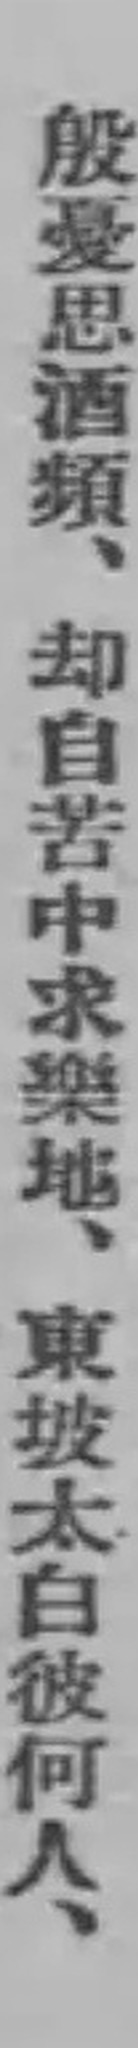殷憂思酒頻、却自苦中求楽地、東坡太白彼何人、
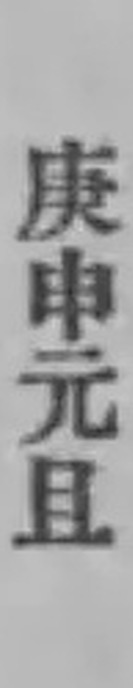庚申元旦
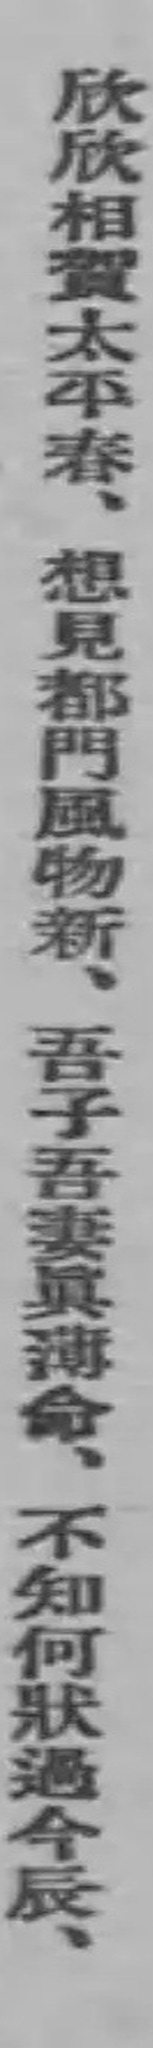欣欣相賀太平春、想見都門風物新、吾子吾妻眞薄命、不知何状過今辰、
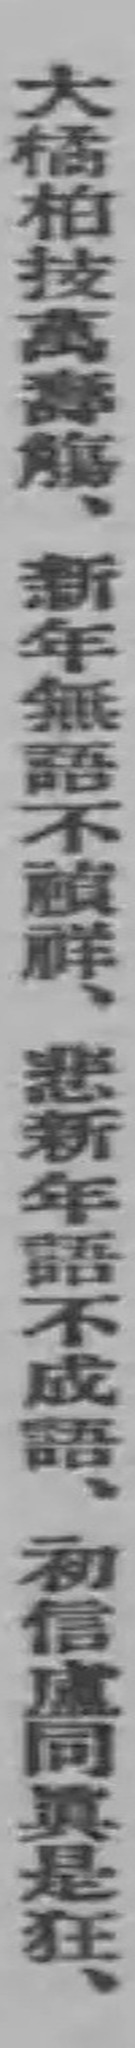大橘柏技萬壽觴、新年無語不禎祥、悲新年語不成語、初信廬同眞是狂、
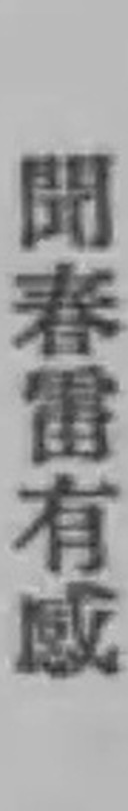聞春雷有感
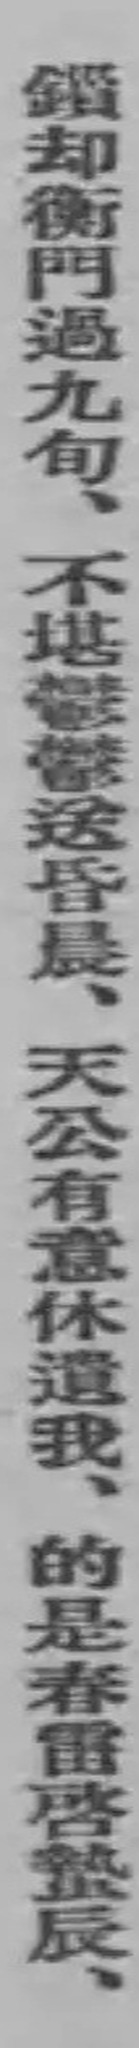鎖却衡門過九旬、不堪鬱鬱送昏晨、天公有意休遣我、的是春雷啓蟄辰、
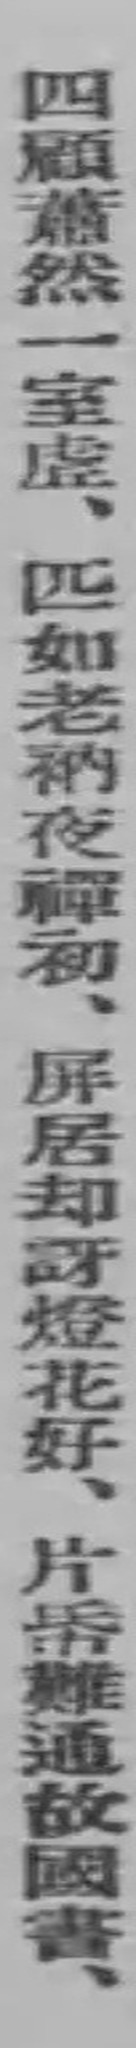四顧粛然一室虗、匹如老衲夜禅初、屏居却訝燈花好、片帋難通故国書、
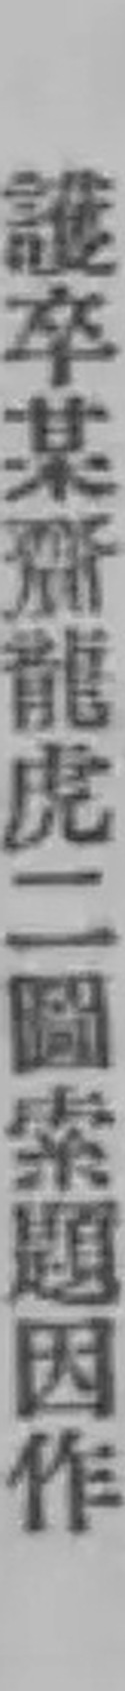円護卒某齎龍虎二円索題因作
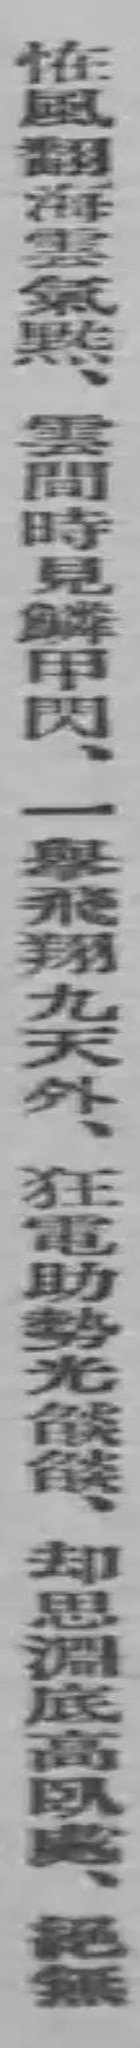恠風翻海雲気黙、雲間時見鱗甲閃、一挙飛翔九天外、狂電助勢光燄燄、却思淵底高卧処、絶無
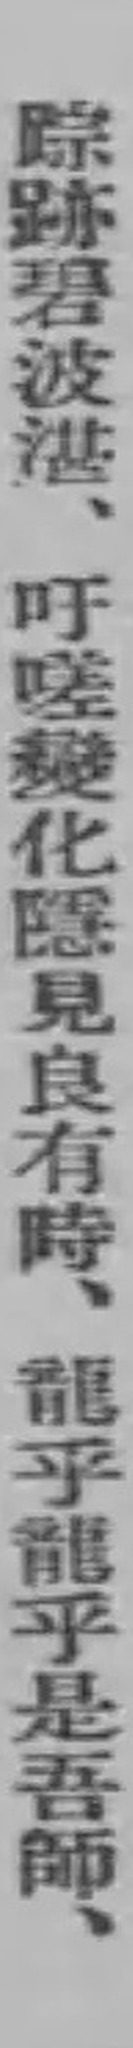踪跡碧波湛、吁嗟変化隠見良有時、龍乎龍乎是吾師、
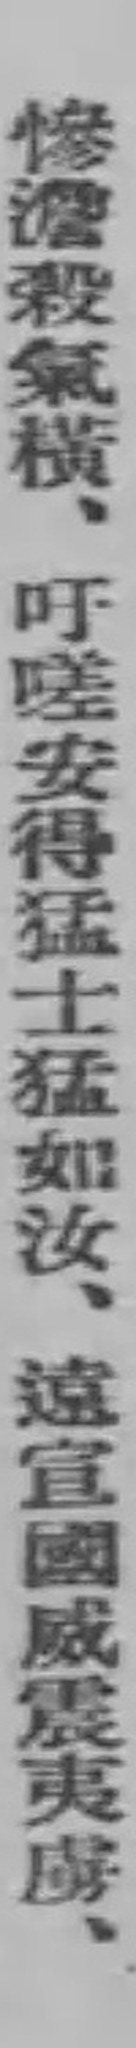惨澹殺気横、吁嗟安得猛士猛如汝、遠宣国威震夷虜、
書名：豊橋市史談
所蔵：国立国会図書館 National Diet Library, JAPAN
